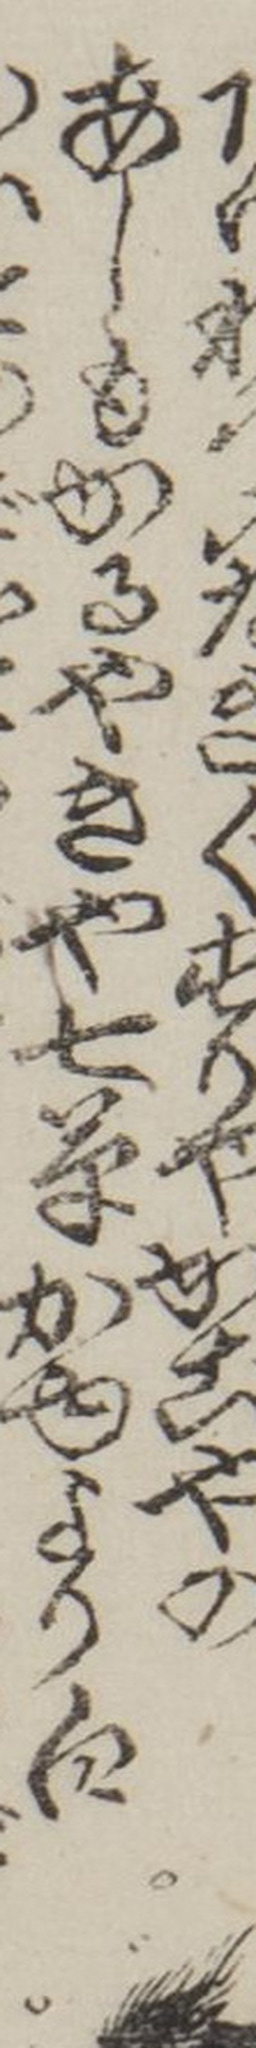あしもかるやきや七草かゆより白
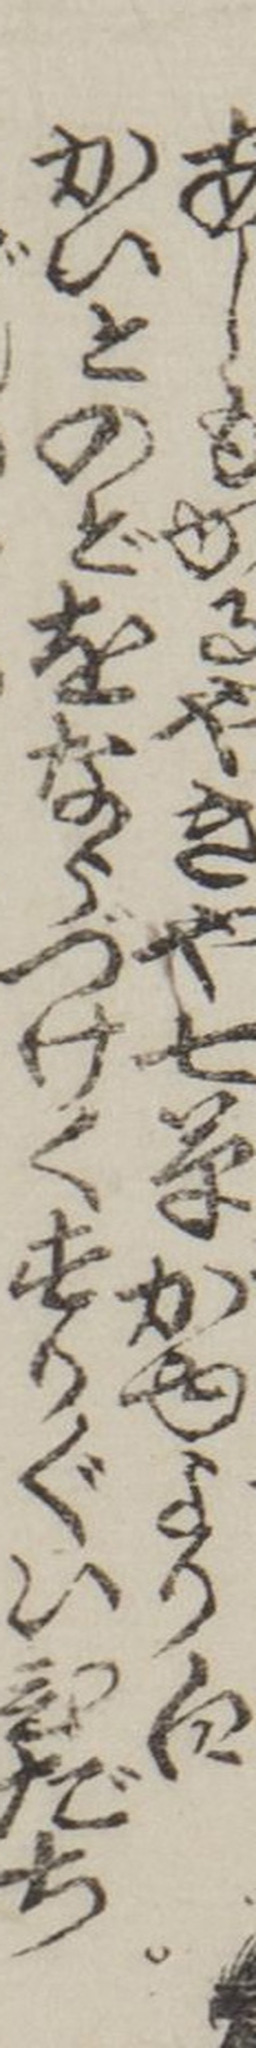かいとのどをならづけくすりぐひひだち
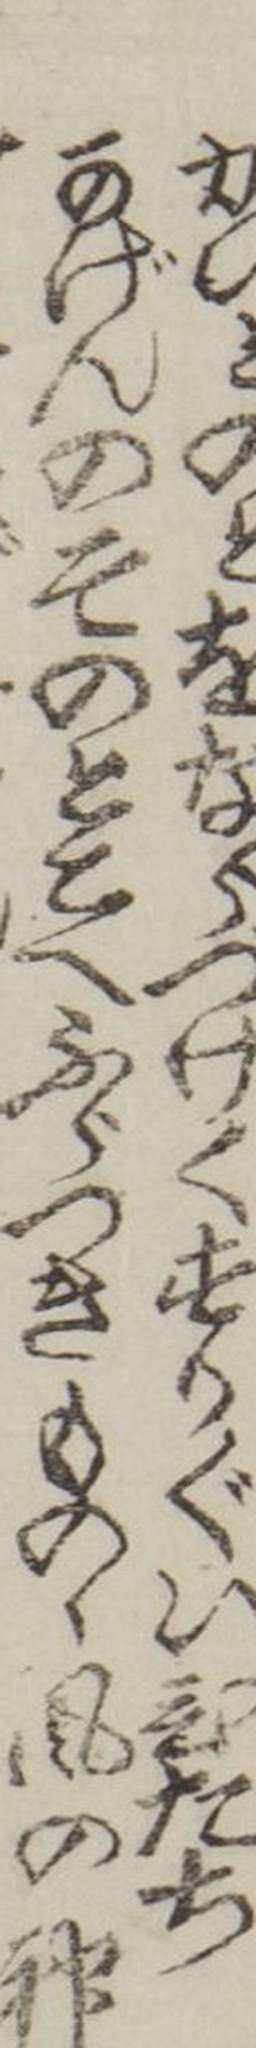かげんのそのとこへふらつきものゝ風の神
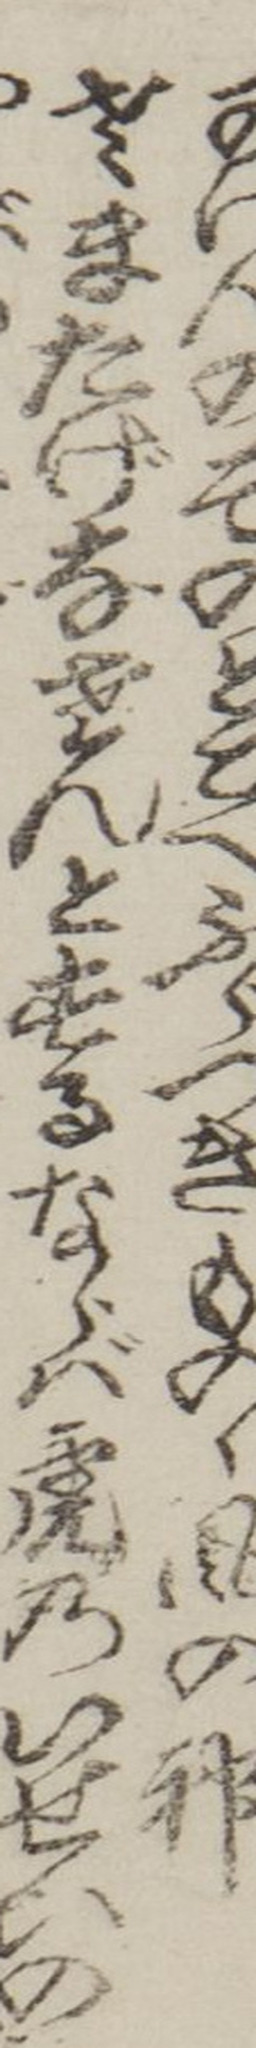さまたげなさんとするならば虎のいせいの
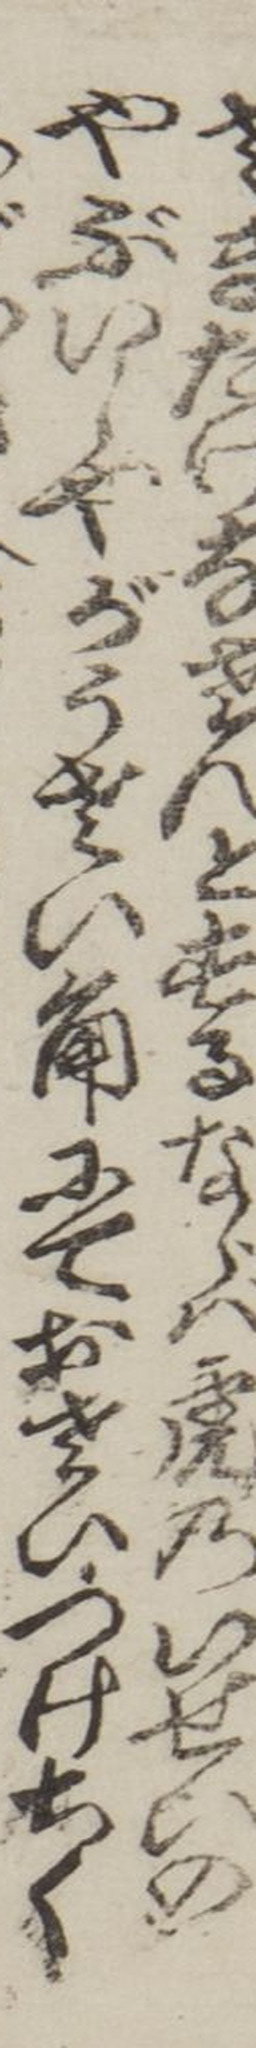やぶいしやがうさい角にておさいつけちく
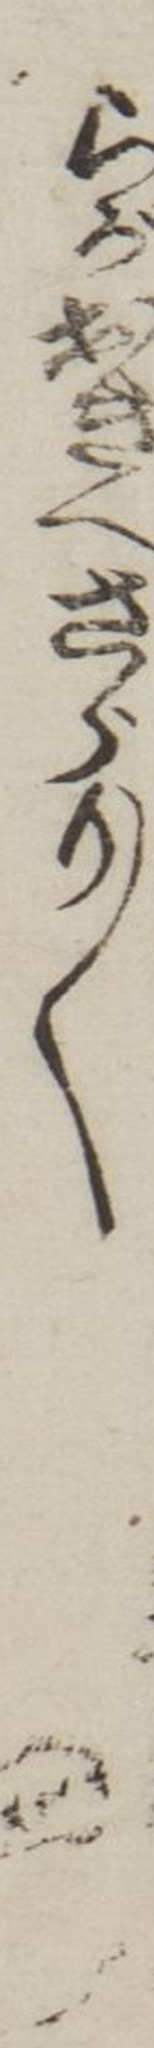らがおきへさらり〳〵
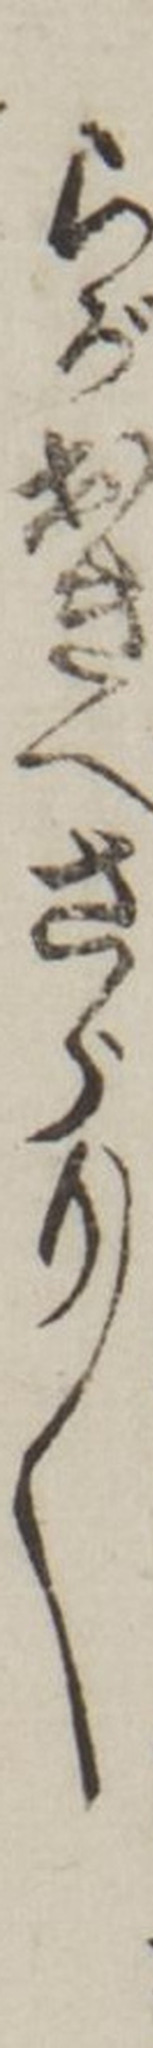らがおきへさらり〳〵
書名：流行痲疹やくばらい
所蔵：あいおいニッセイ同和損保株式会社
